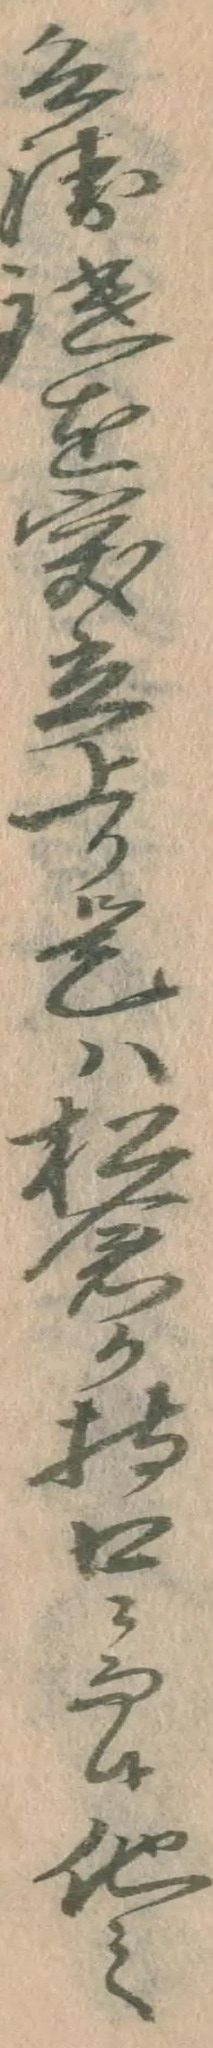兵衛鑓を突立上り是は松倉か持口に而候他之
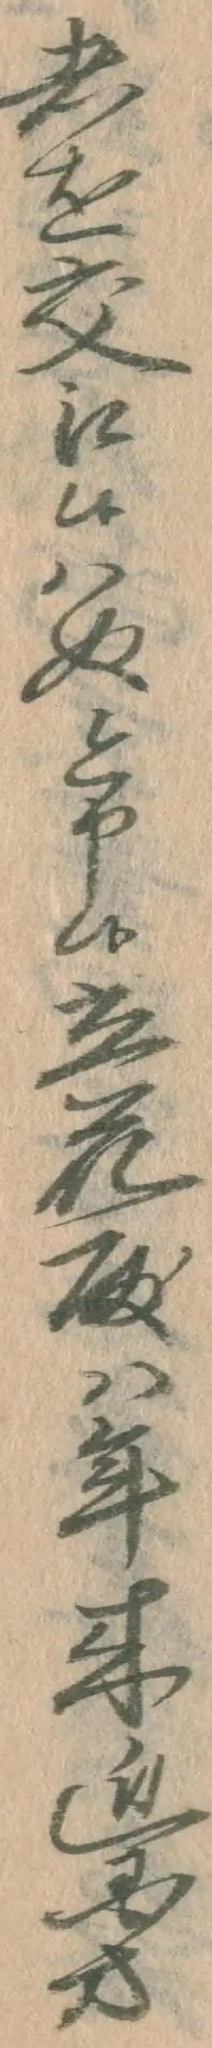者を交江候はぬと申候立花殿は年来近国方
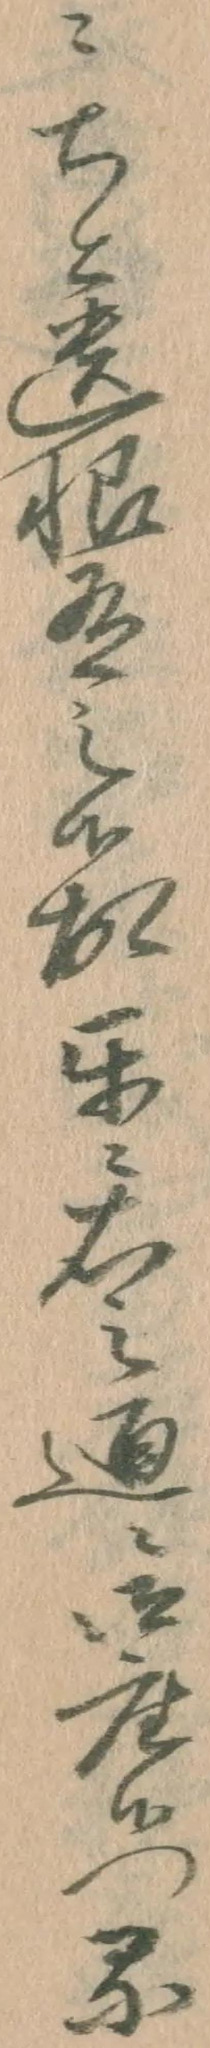にちと遺恨有之候故互に右之通に御座候つる
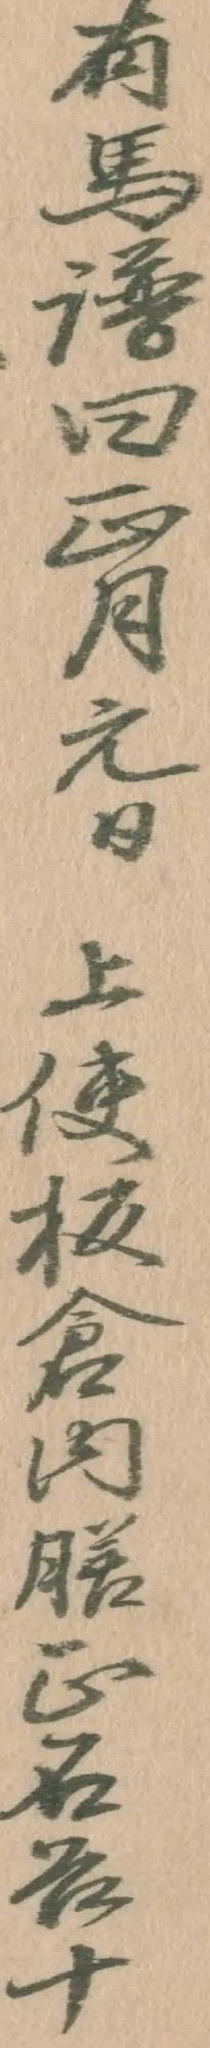有馬譜曰正月元日上使板倉内膳正石谷十
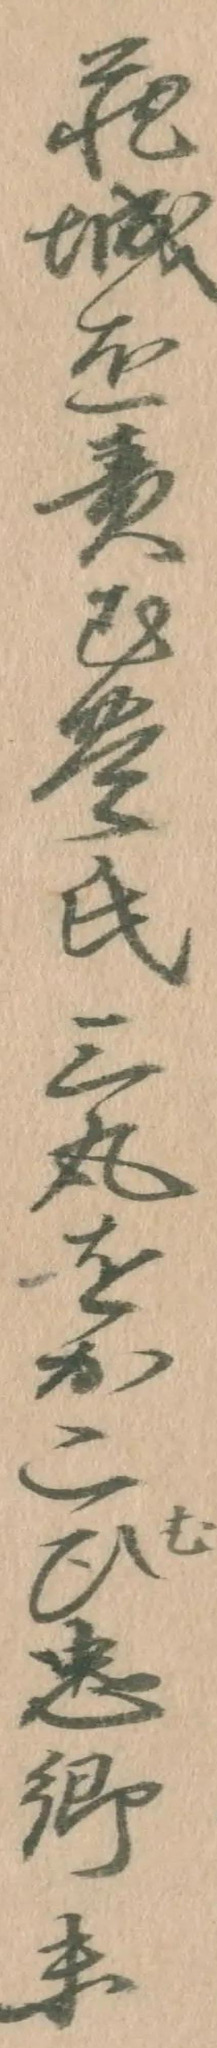蔵城を責む豊氏三丸をかこむ忠郷未
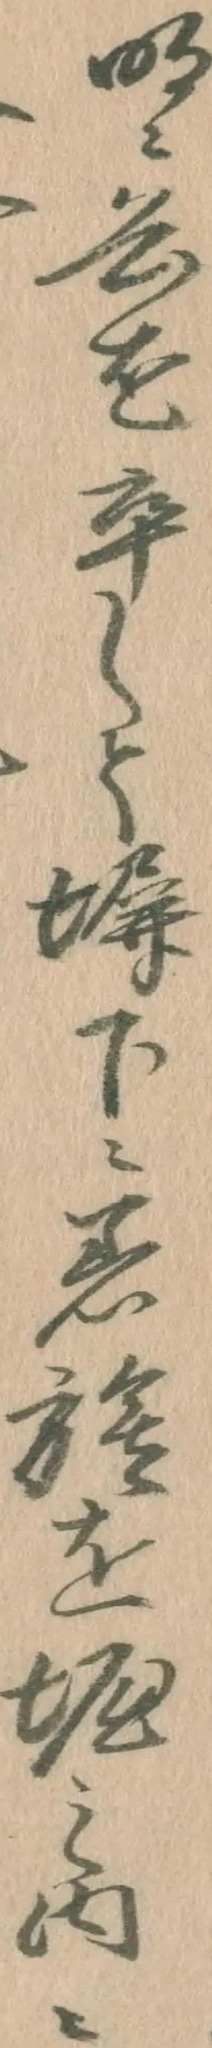明に兵を卒して塀下に着族を堀之内に
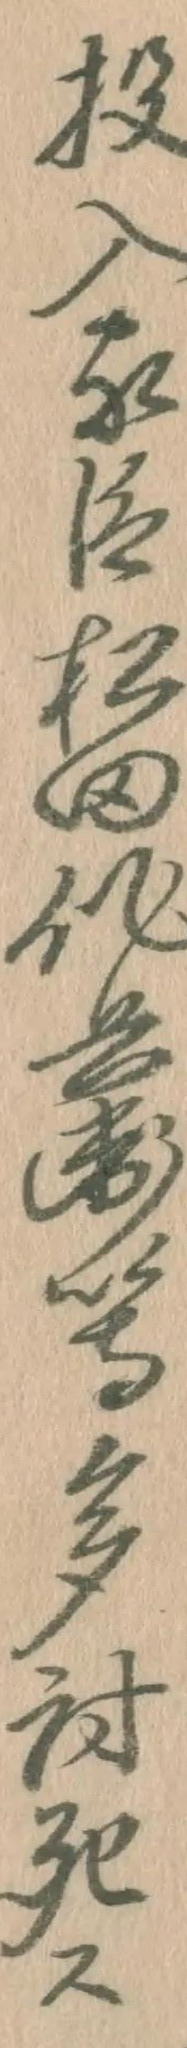投入家臣松田作兵衛等多討死す

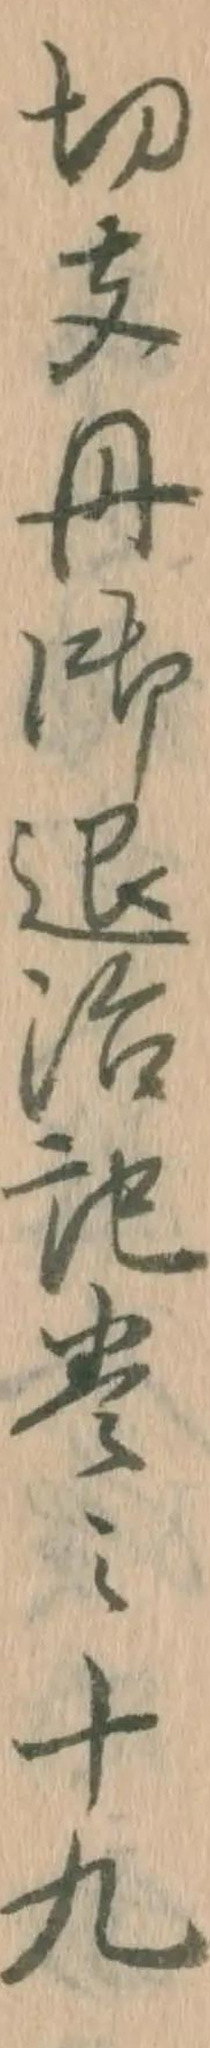切支丹御退治記巻之十九
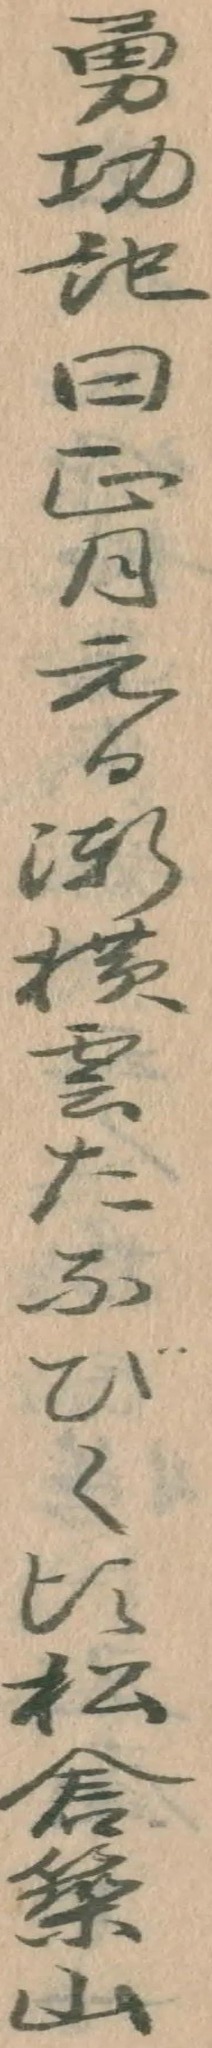勇功記曰正月元日漸横雲たなびく頃松倉築山
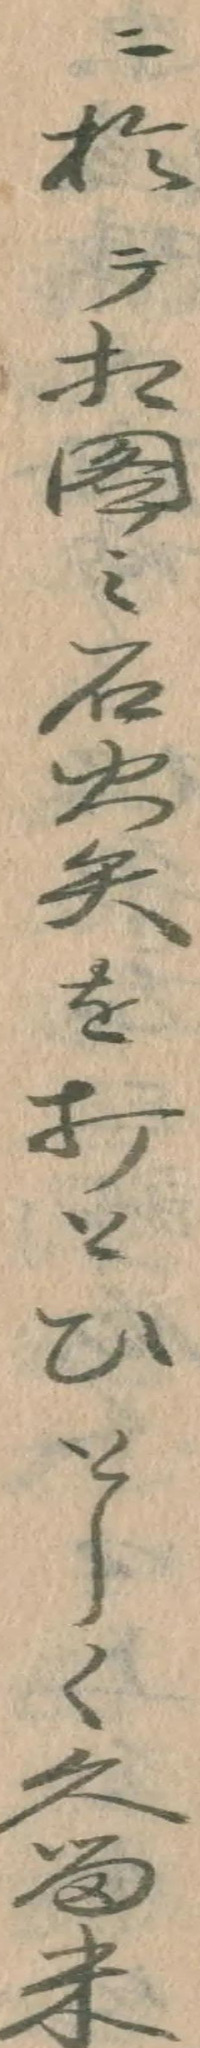に於て相図之石火矢を打とひとしく久留米
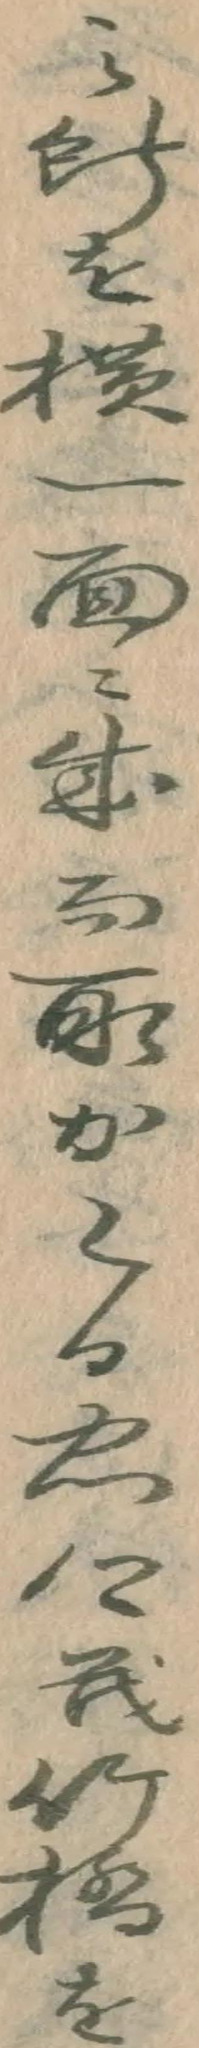之所を横一面に成而取かくる忠郷茂竹橋を
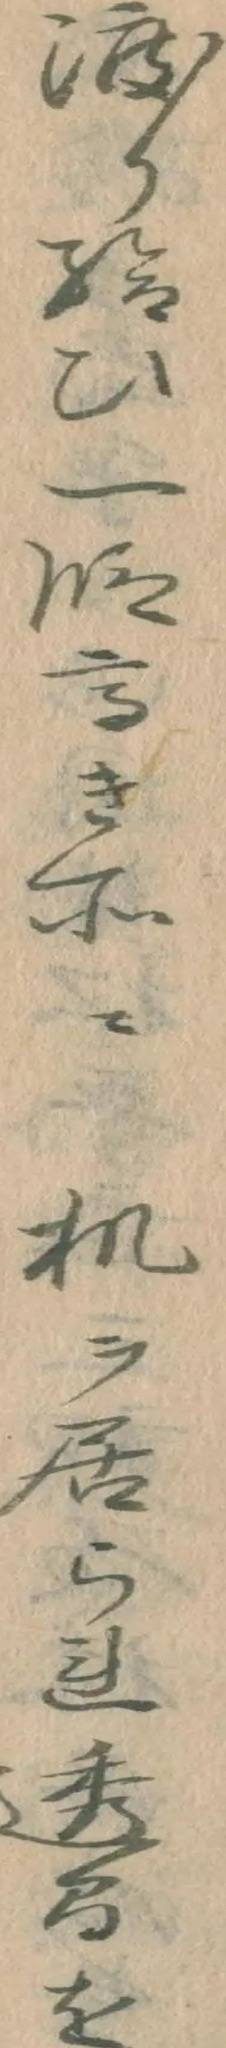渡り給ひ一段高き所に机を居ら連透間を
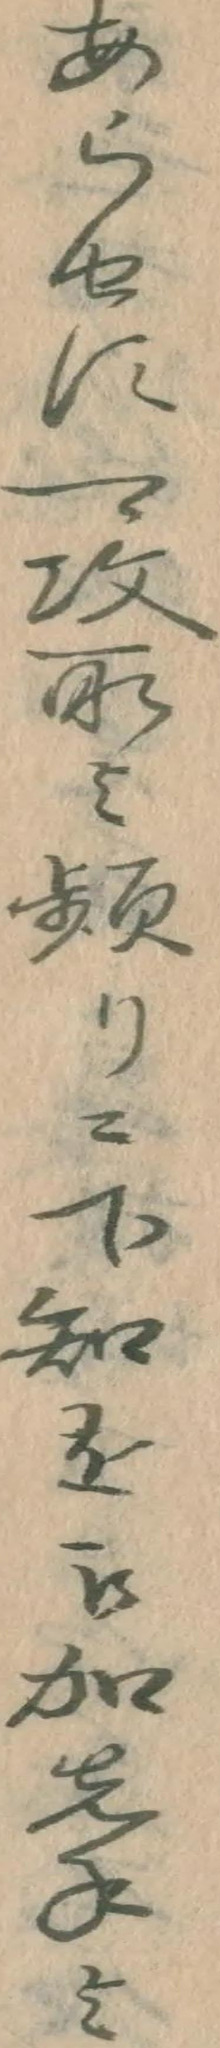あらせ須可攻取与頻りに下知を被加先手与
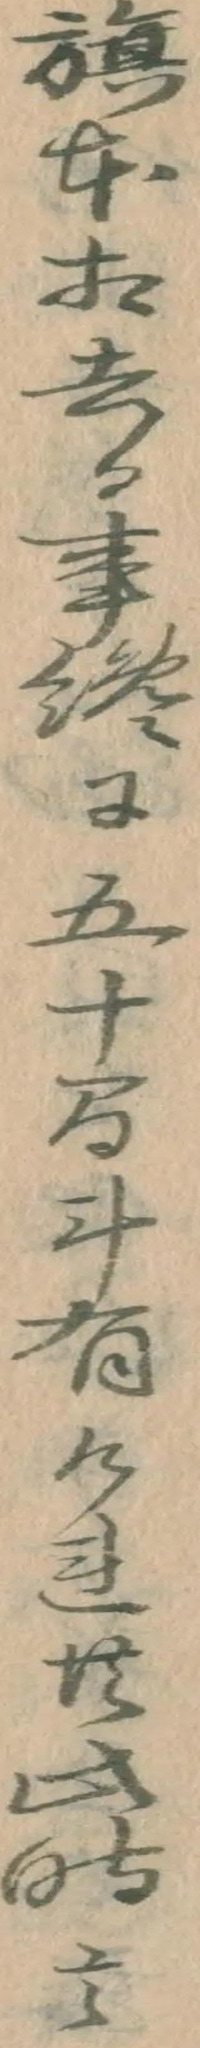旗本相去る事纔尓五十間斗有け連共此時者
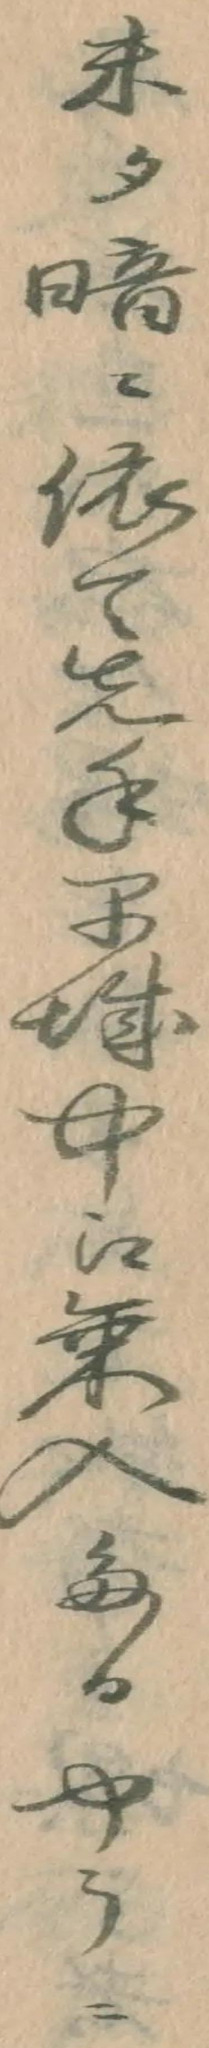未た暗に依て先手早城中江乗入多るやうに

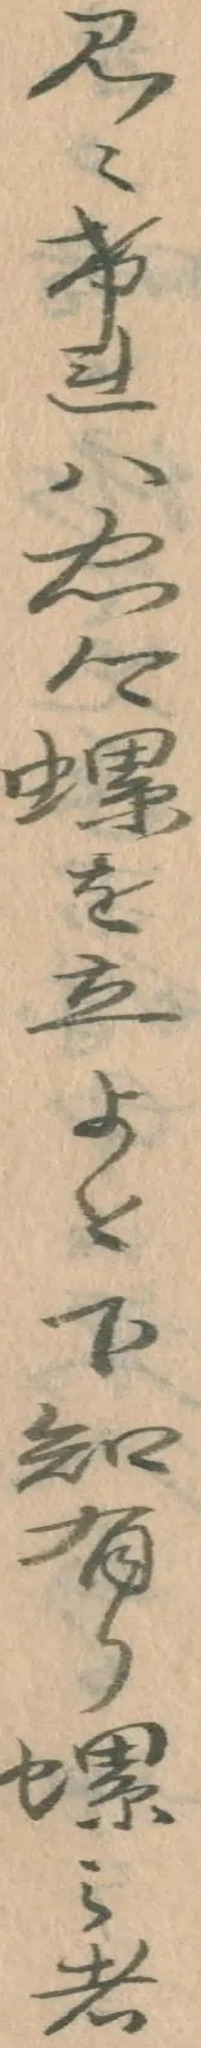見に希連は忠郷螺を立よと下知有り螺之者
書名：切支丹御退治記 49巻. [5]
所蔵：国立国会図書館 National Diet Library, JAPAN
